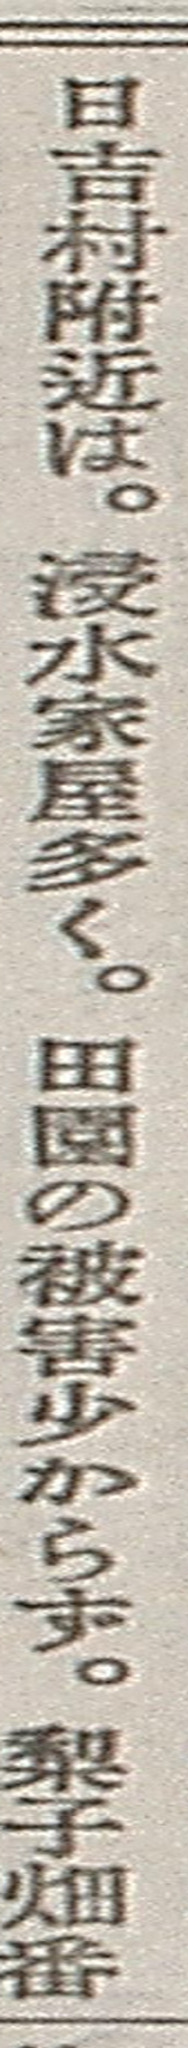日吉村附近は。浸水家屋多く。田圃の被害少からず。梨子畑番
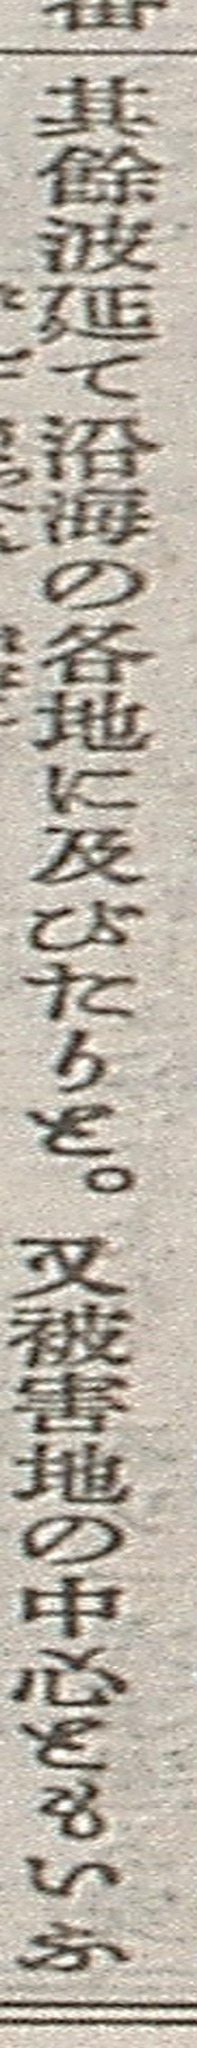其余波延て沿海の各地に及びたりと。又被害地の中心ともいふ
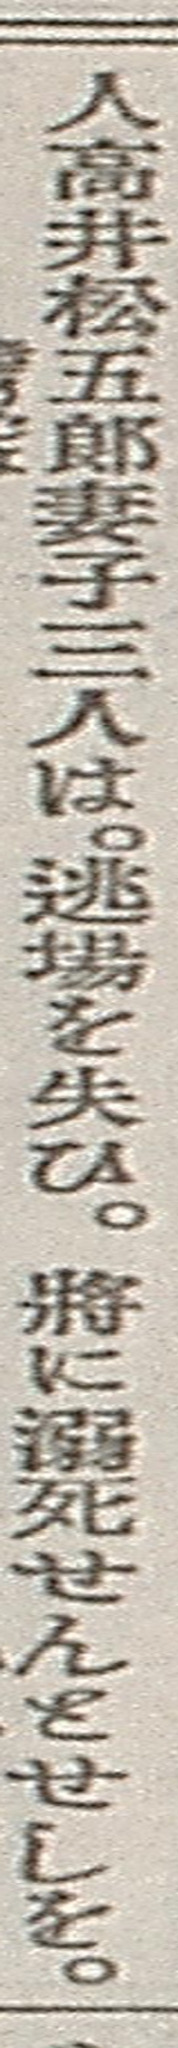人高井松五郎妻子三人は。逃場を失ひ。将に溺死せんとせしを。
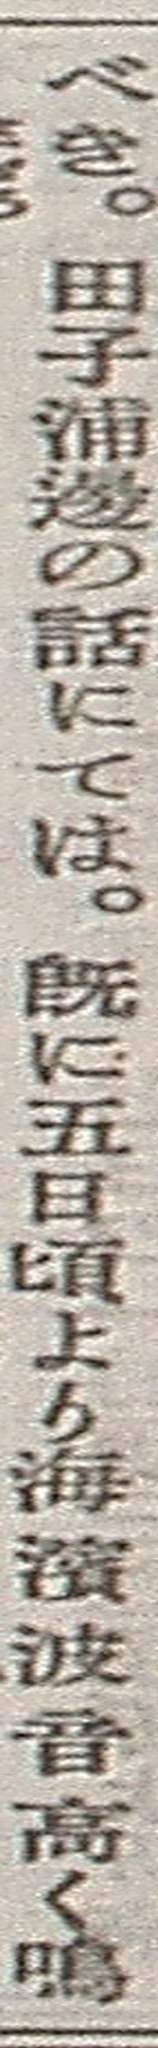べき。田子浦辺の話にては。既に五日頃より海浜波音高く鳴
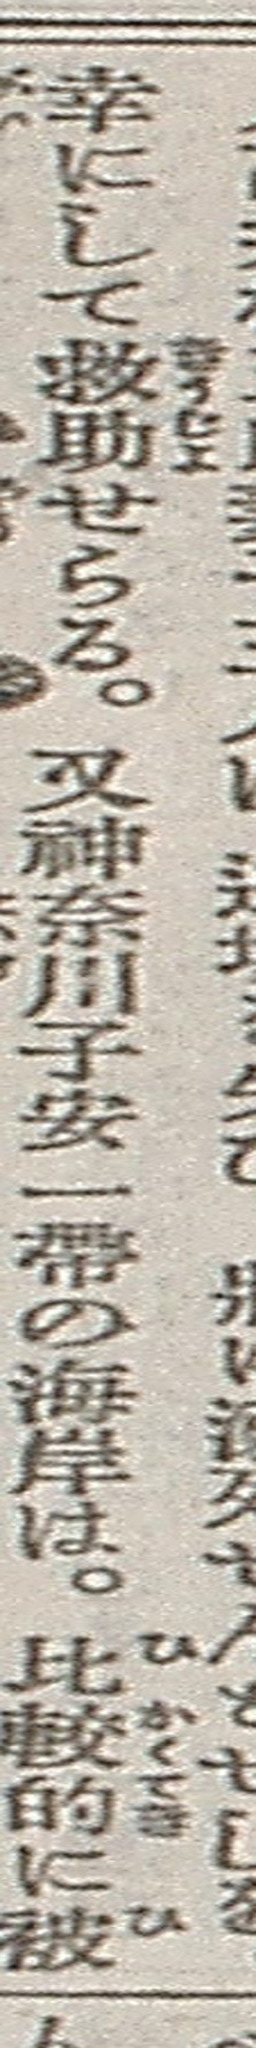幸にして救助せらる。又神奈川子安一帯の海岸は。比較的に被
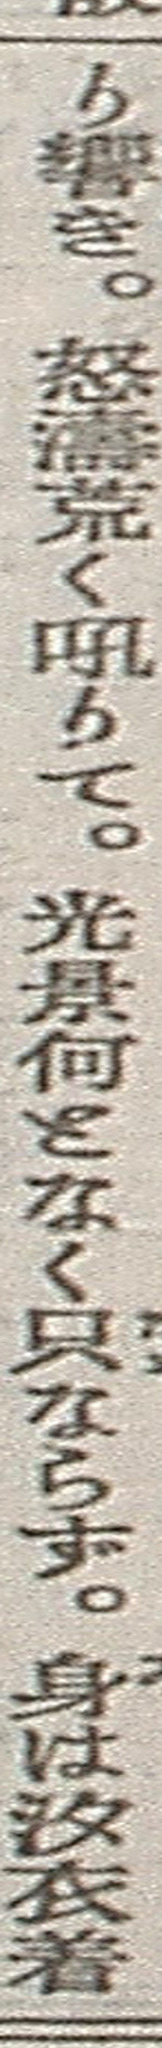り響き。怒涛荒く吼りて。光景何となく只ならず。身は汐衣着
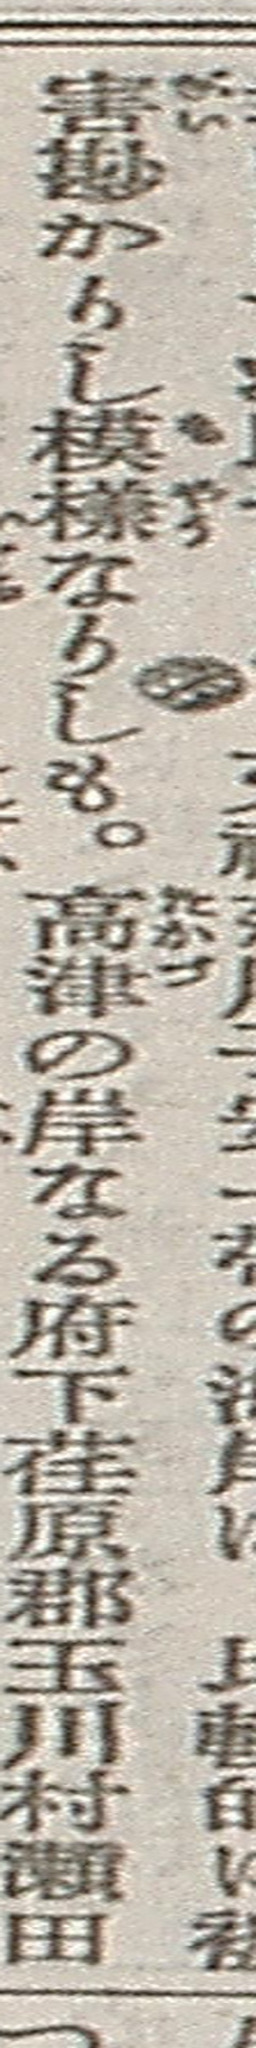害尠かりし模様なりしも。高津の岸なる府下荏原郡玉川村瀬田
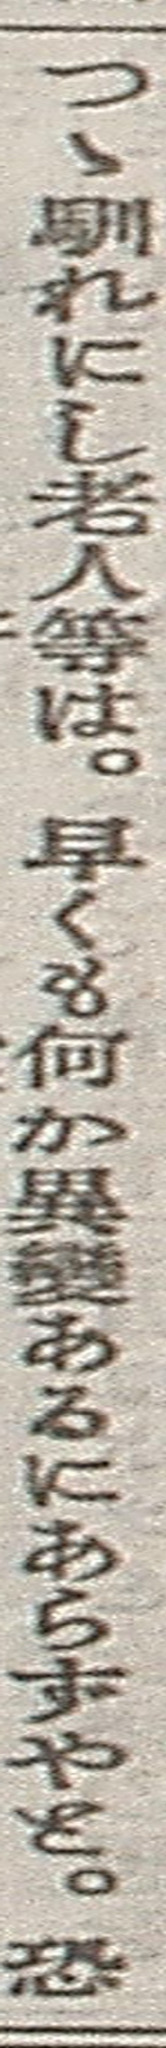つゝ馴れにし老人等は。早くも何か異変あるにあらずやと。恐
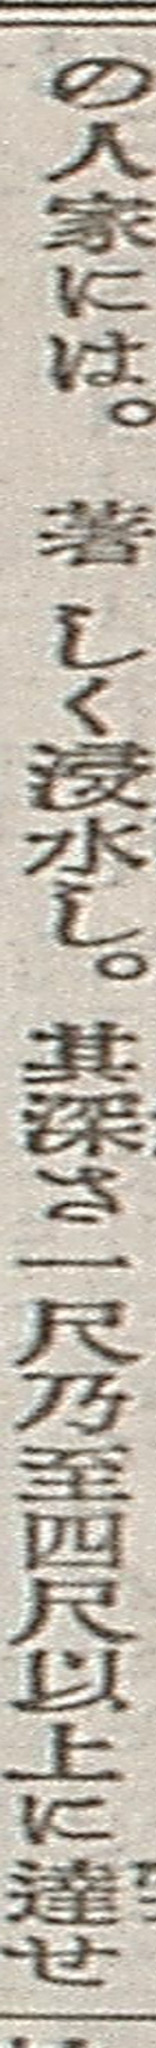の人家には。著しく浸水し。其深さ一尺乃至四尺以上に達せ
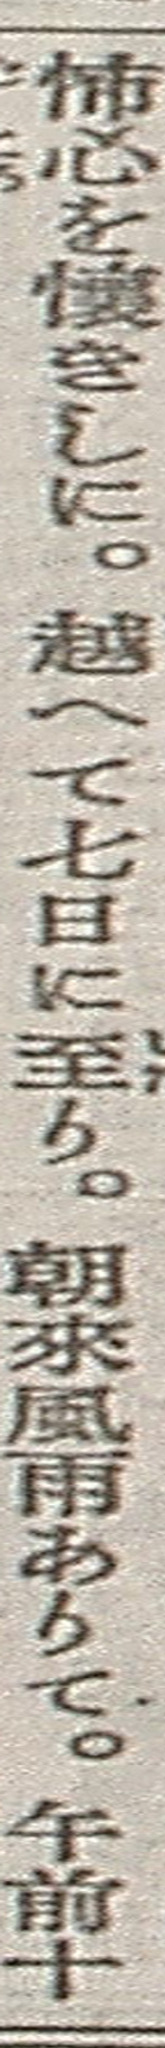怖心を懐きしに。越へて七日に至り。朝来風雨ありて。午前十
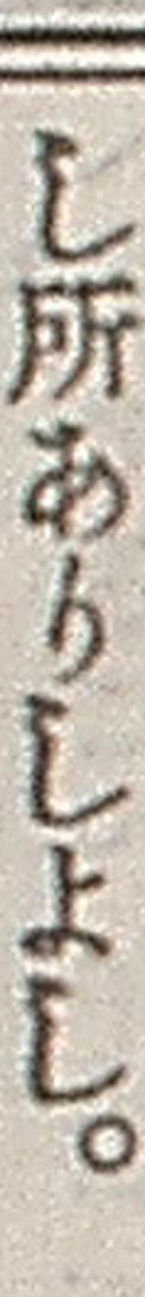し所ありしよし。
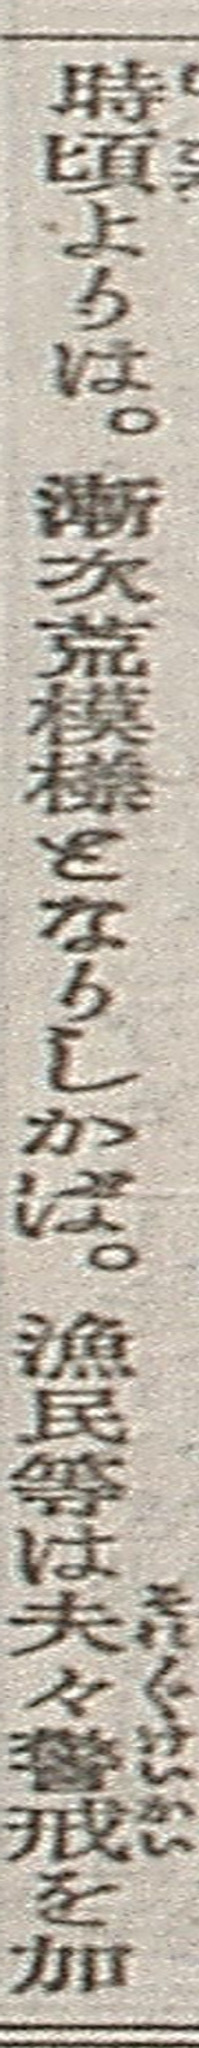時頃よりは。漸次荒模様となりしかば。漁民等は夫々警戒を加

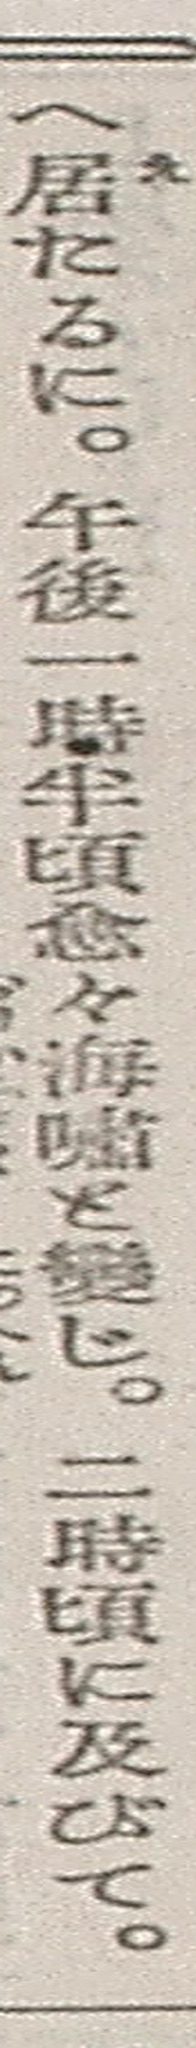へ居たるに。午後一時半頃愈々海嘯と変じ。二時頃に及びて。
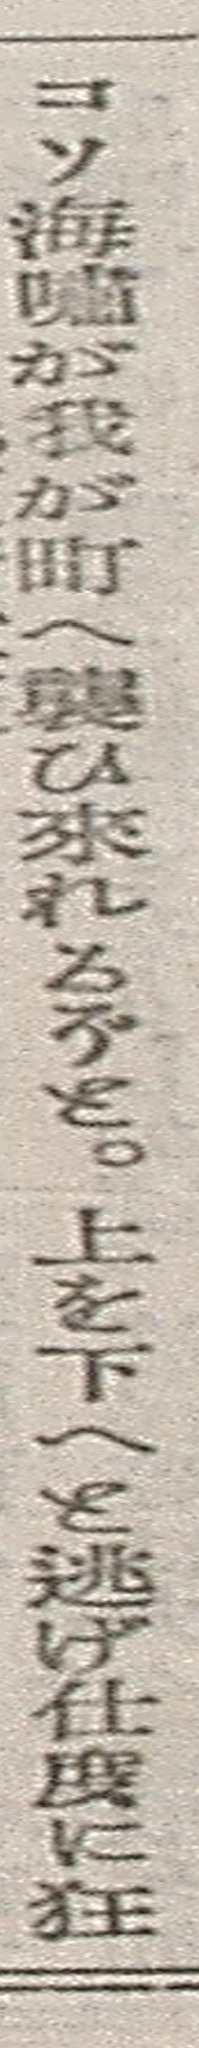コソ海嘯が我が町へ襲ひ来れるぞと。上を下へと逃げ仕度に狂
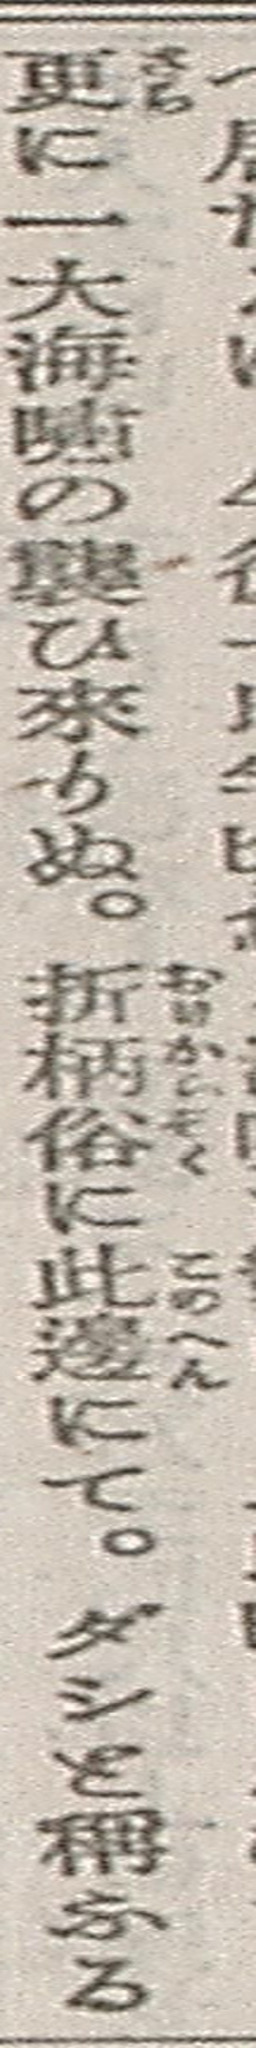更に一大海嘯の襲ひ来りぬ。折柄俗に此辺にて。ダシと称ふる
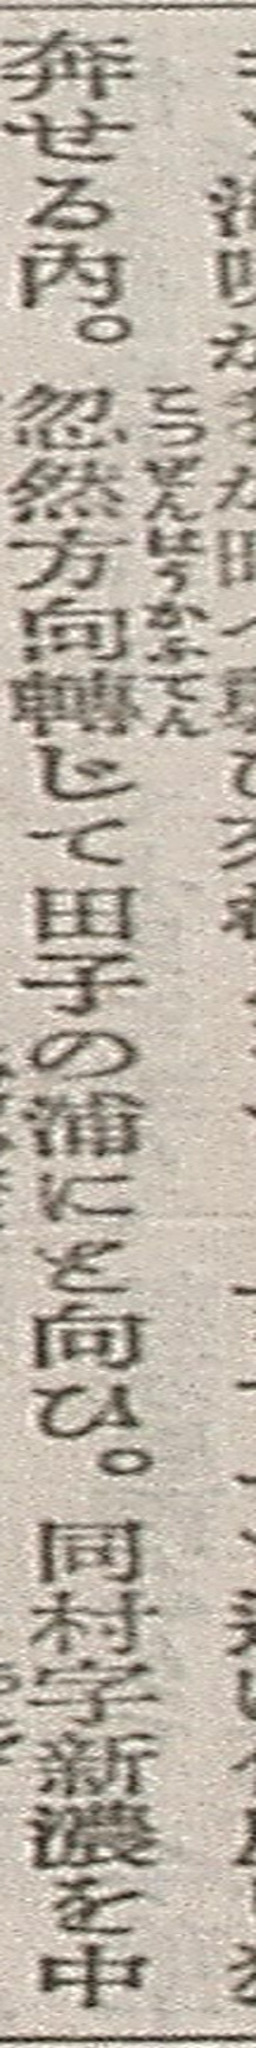奔せる内。忽然方向転じて田子の浦にと向ひ。同村字新濃を中
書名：風俗畫報臨時増刊第百九十九號　明治三十二年十月各地災害圖會（前編之續）
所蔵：東京大学地震研究所図書室 Earthquake Research Institute Library, The University of Tokyo, JAPAN
